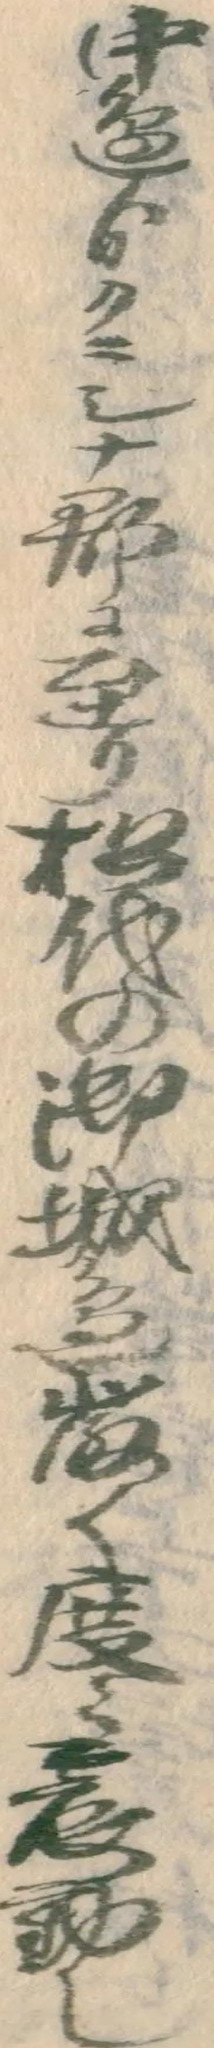中辺ゟクニシナ郡に至り松代の御城辺厳く度々震動し
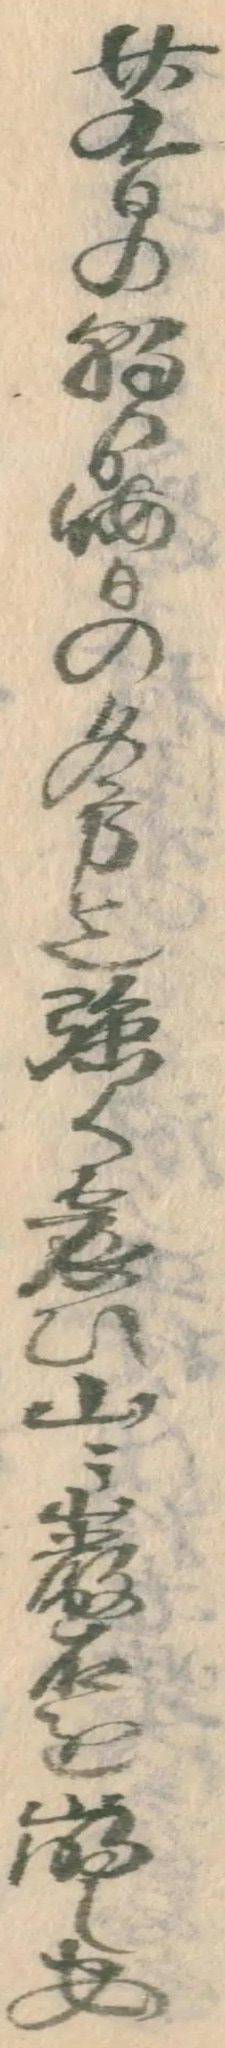廿九日の朝ゟ晦日の夕方迄強く震ひ巌石を崩し安
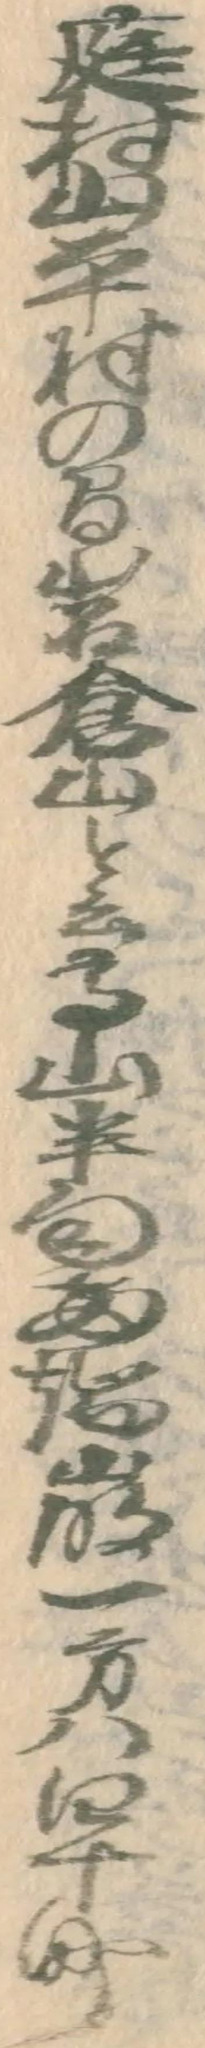庭村山平村の間岩倉山と云高山半分両端崩一方ハ四十丁町

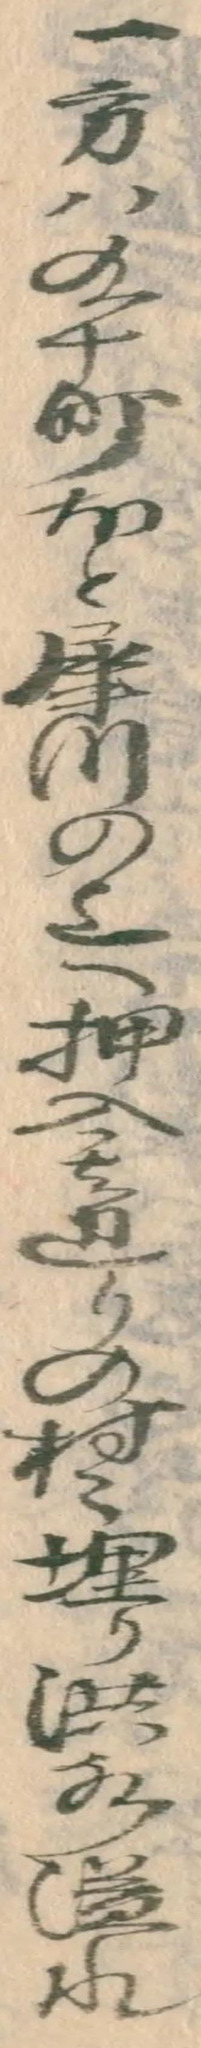一方ハ九十町ほと犀川の上へ押入其辺りの村々埋り洪水溢れ
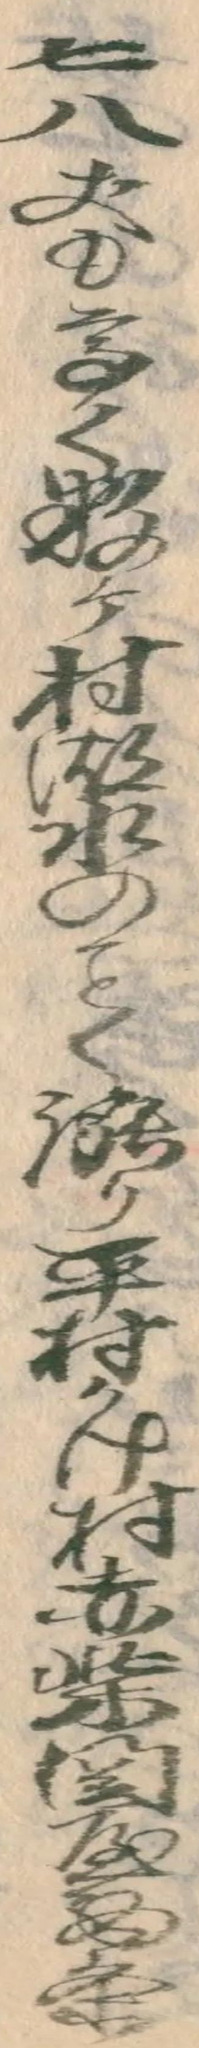七八丈も高く数ヶ村湖水のことく漲り平村かけ村赤柴関屋西条
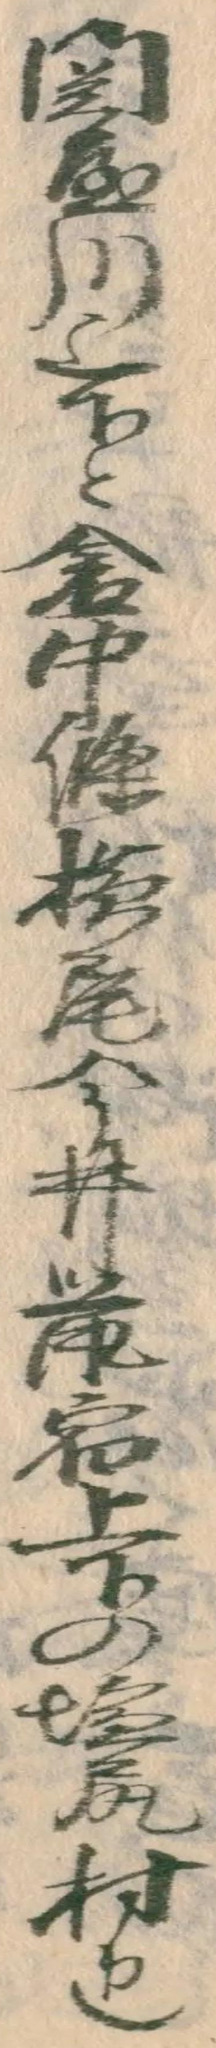関屋川上下と倉中條横尾今井鼠宿上下の塩尻村辺
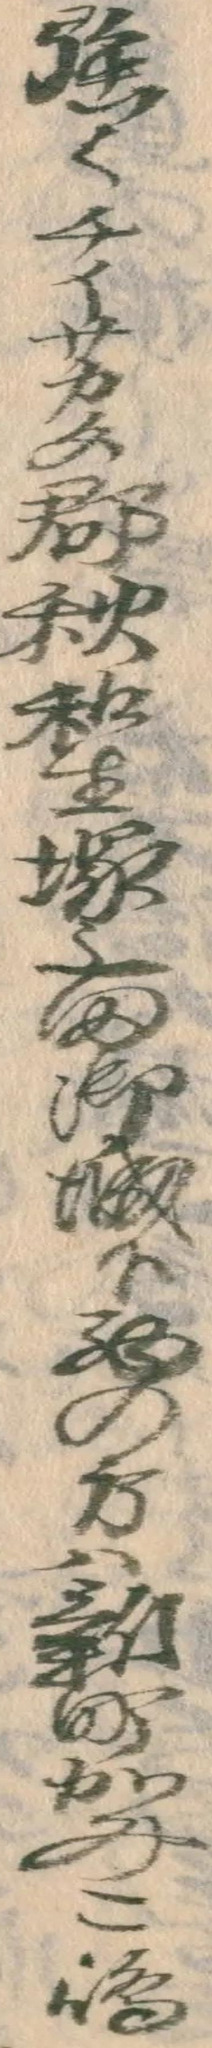強くチイサカタ郡秋和生塚上田御城下西の方ハ新町かみこ嶋
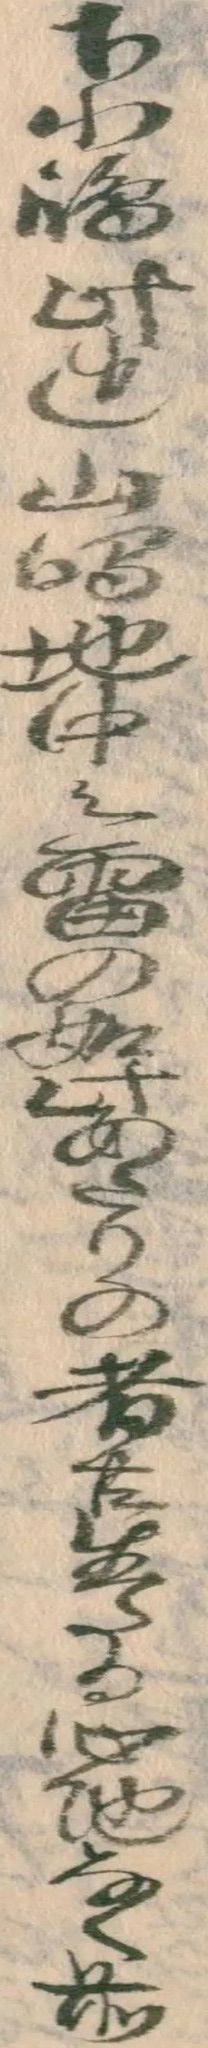下小嶋此辺山鳴地中之雷の如此あたりの者共生たる心地なく前
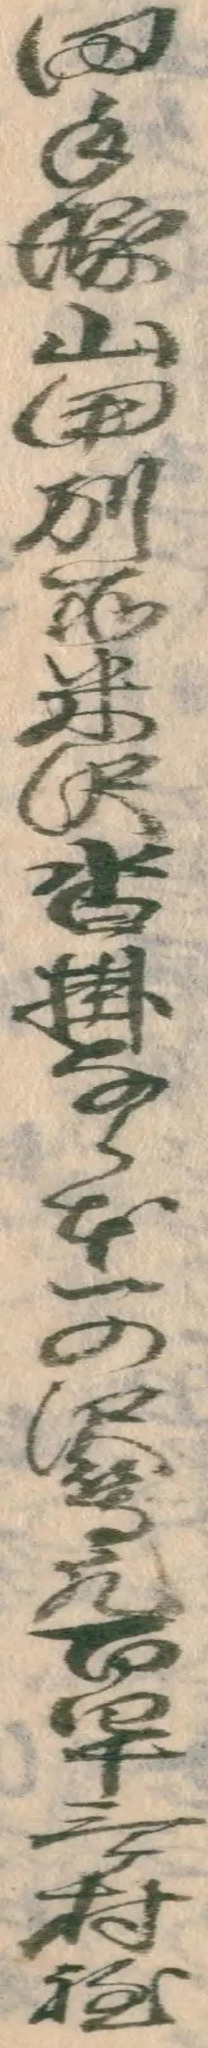田手塚山田別所米沢沓掛なら本一の沢等凡百四十三ヶ村程
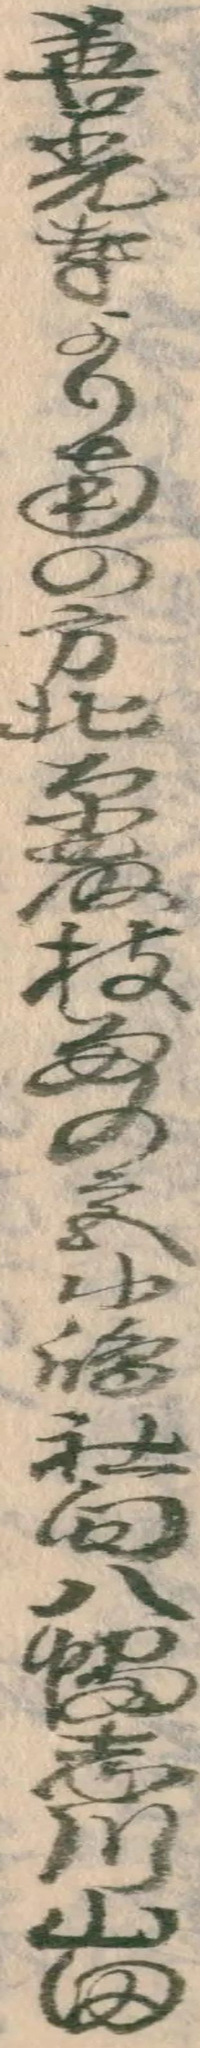善光寺より南の方北原藤枝しの宮小嶋社向八幡志川山田
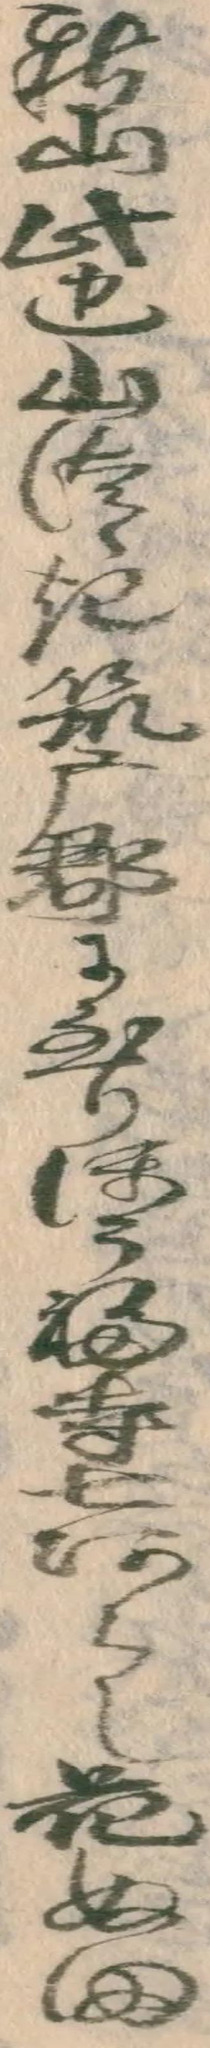龍山此辺山つつき筑摩郡に至りほう福寺七ならし花ぬた
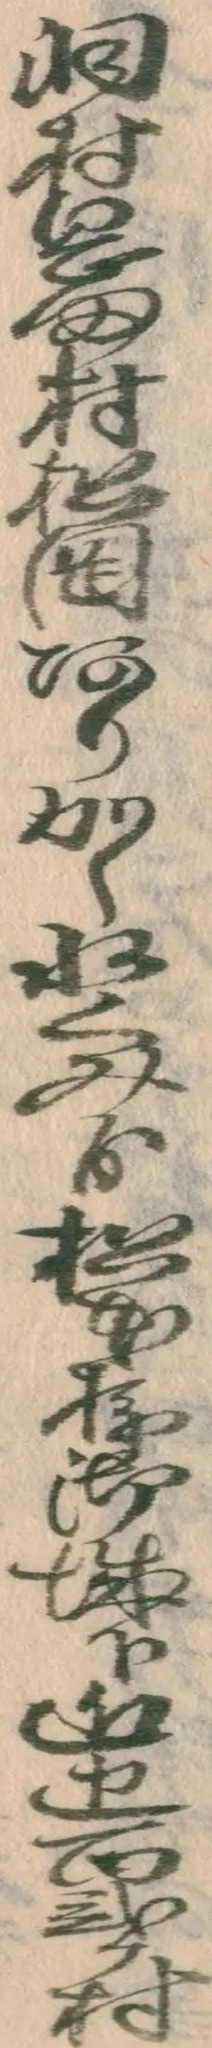洞村岡田村松岡ありかねくみゟ松本様御城下近辺百弐ヶ村程
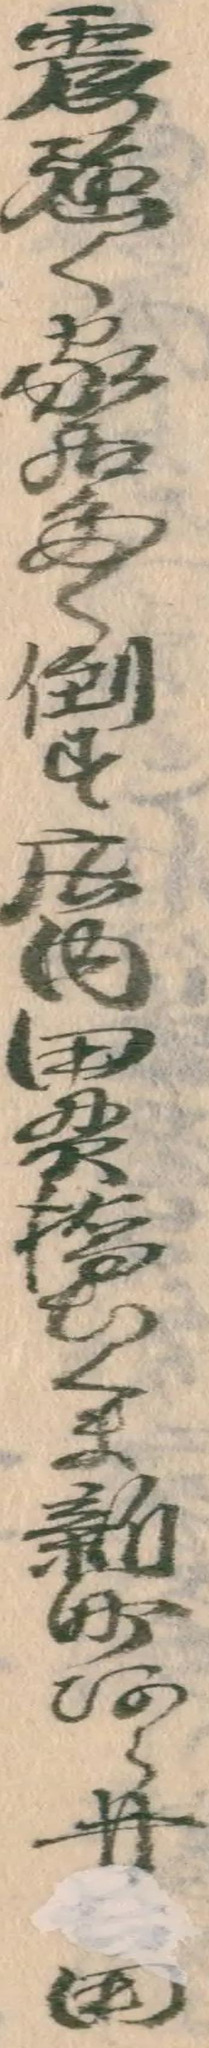震強く家居悉く倒れ庄内田貫橋むくま新町なら井田
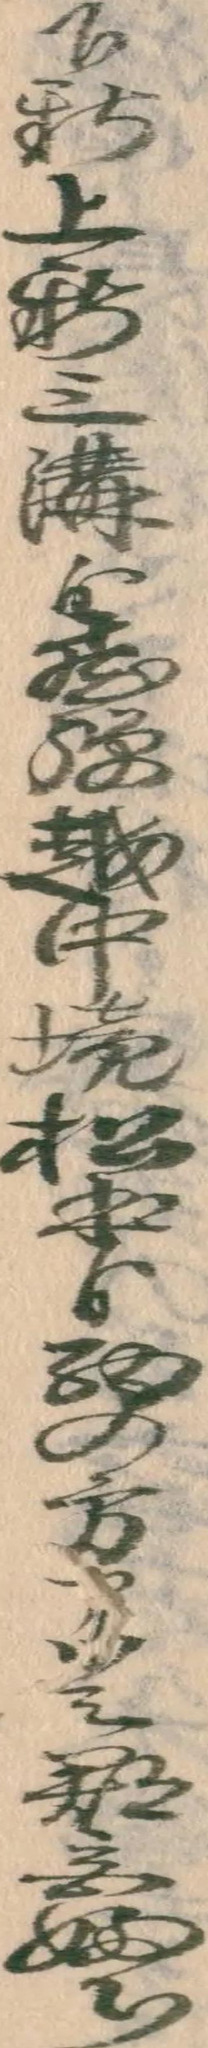下軒上軒下三溝ゟ飛驒越中境松本ゟ西の方アズミ郡みや宮ふり
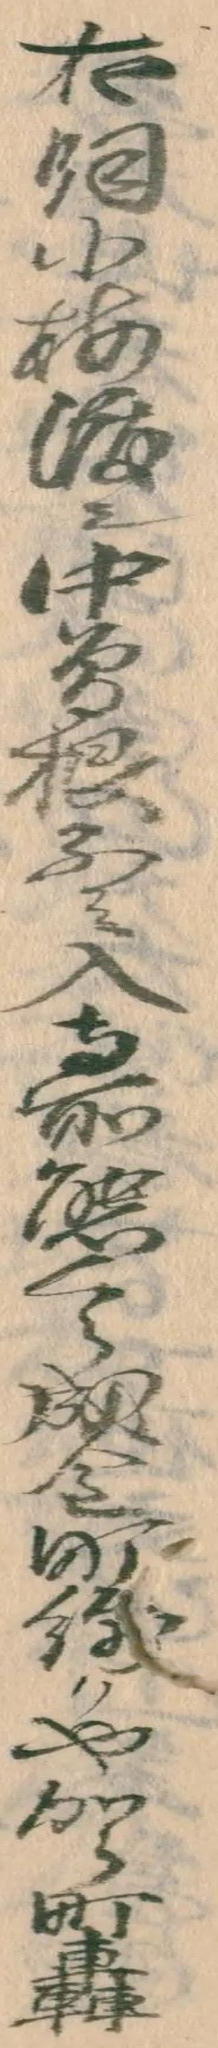左飼小梅渡シ中曽根ふミ入寺所熊くら成金町織りやから町轟
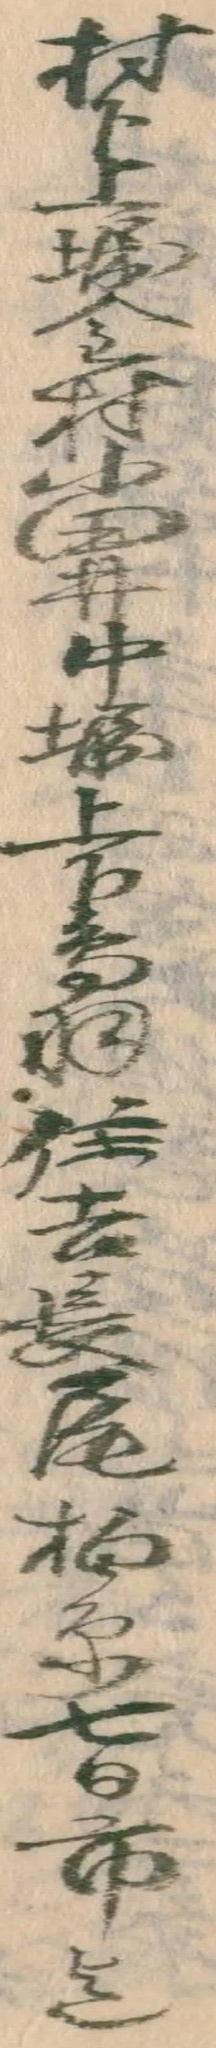村下上堀金村小田井中堀上下鳥羽住吉長尾柏原七日市迄
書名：信州大地震之記
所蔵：国立国会図書館 National Diet Library, JAPAN
